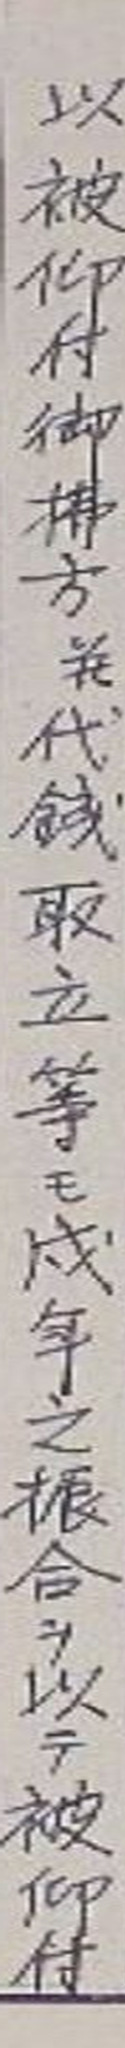以被仰付御払方并代銭取立等も戌年之振合を以て被仰付
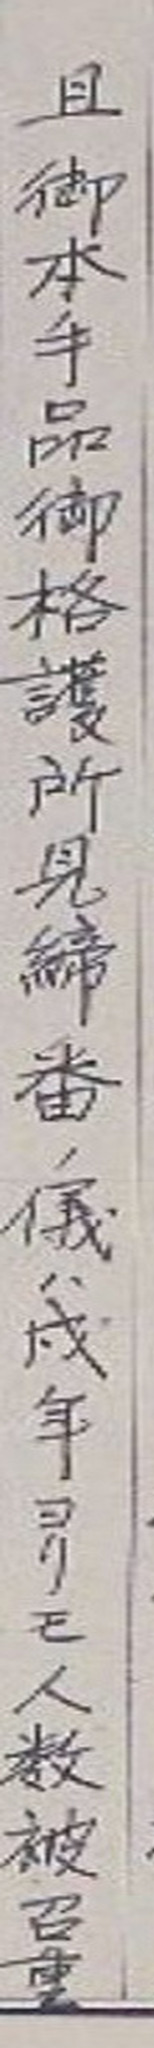且御本手品御格護所見締番の儀は戌年よりも人数被召重
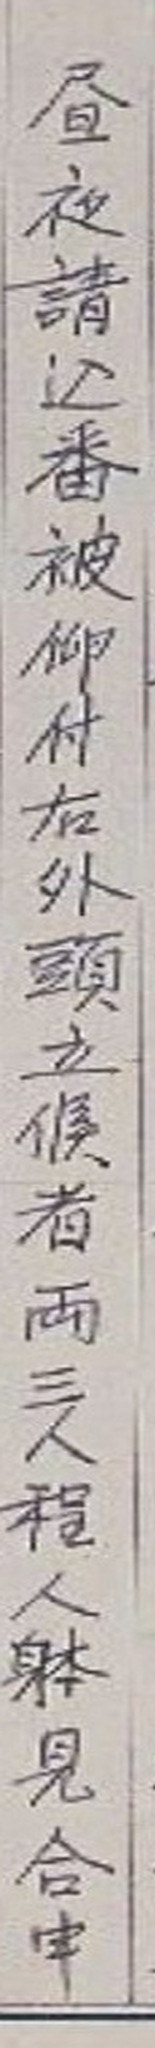昼夜請込番被仰付右外頭立候者両三人程人躰見合申
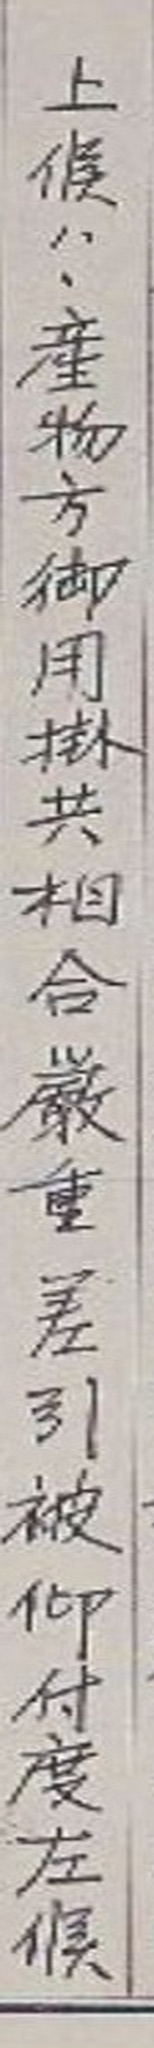上候はゝ産物方御用掛共相合厳重差引被仰付度左候
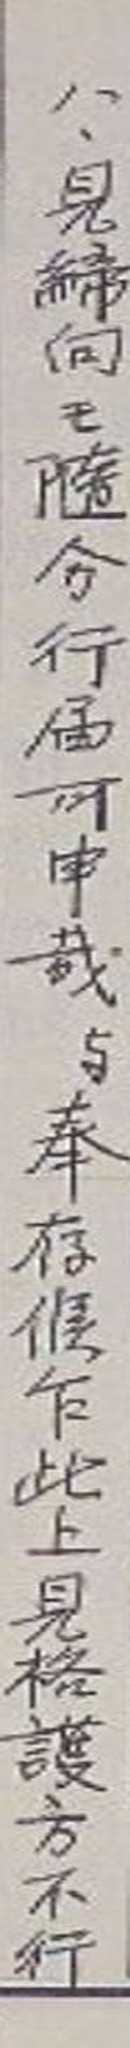はゝ見締向も随分行届可申哉と奉存候乍此上見格護方不行
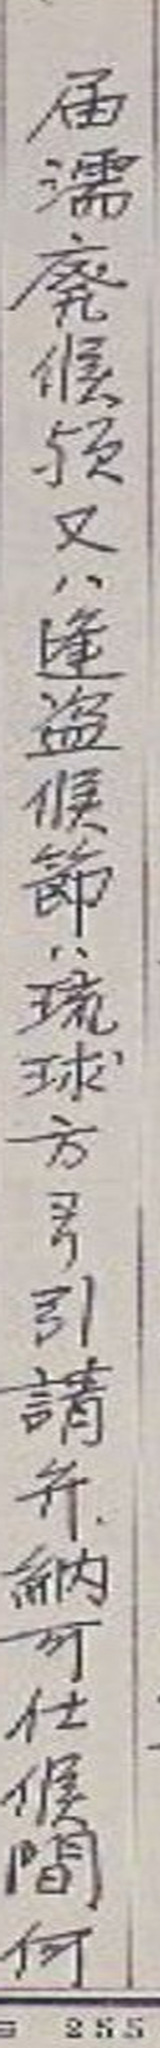届濡廃候歟又は逢盗候節は琉球方より引請弁納可仕候間何
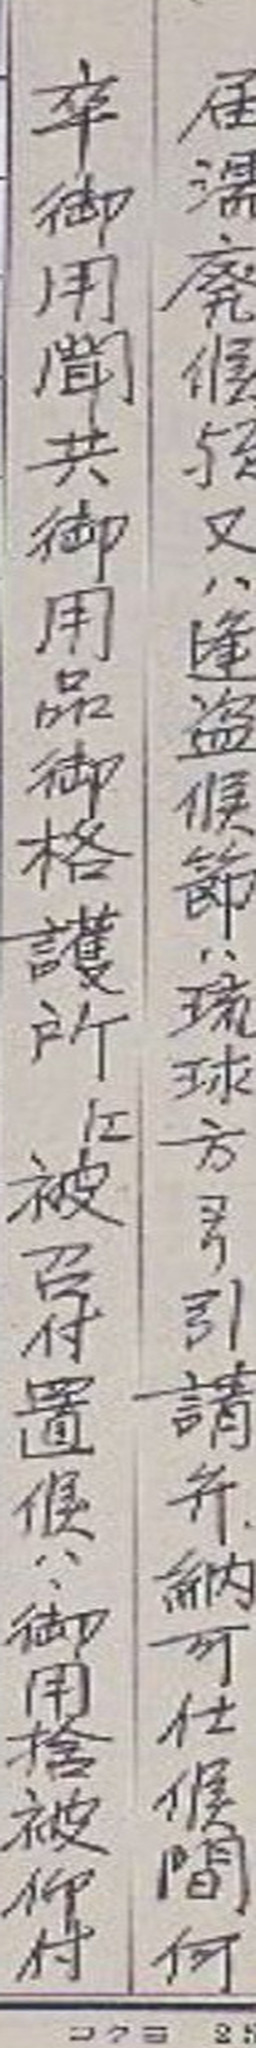卒御用聞共御用品御格護所え被召付置候はゝ御用捨被仰付
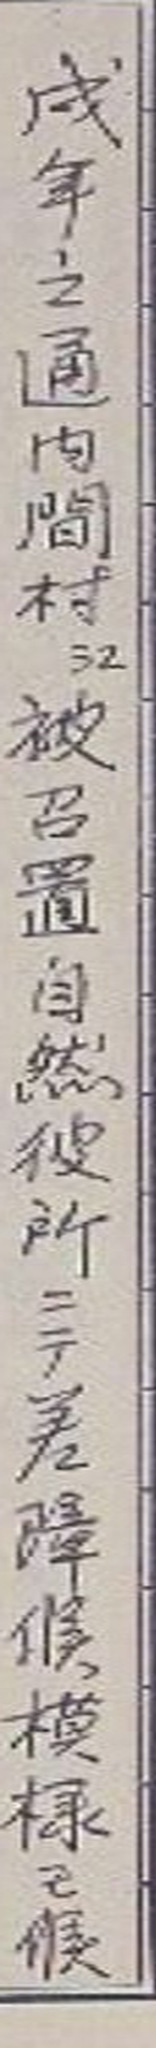戌年之通内間村え被召置自然彼所にて差障候模様も候
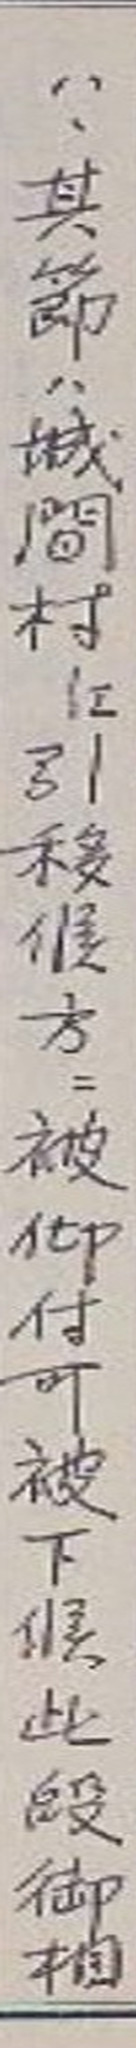はゝ其節は城間村え引移候方に被仰付可被下候此段御相
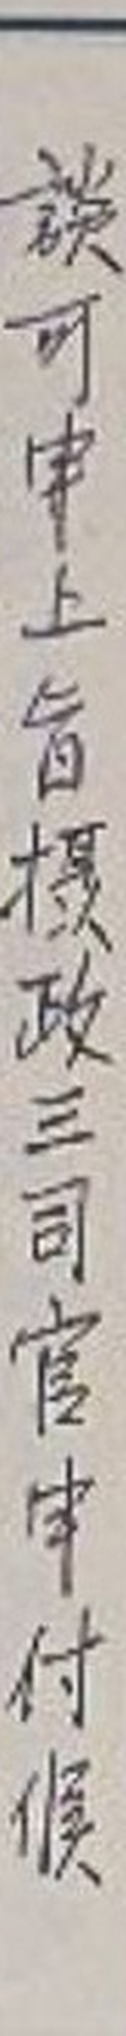談可申上旨摂政三司官申付候
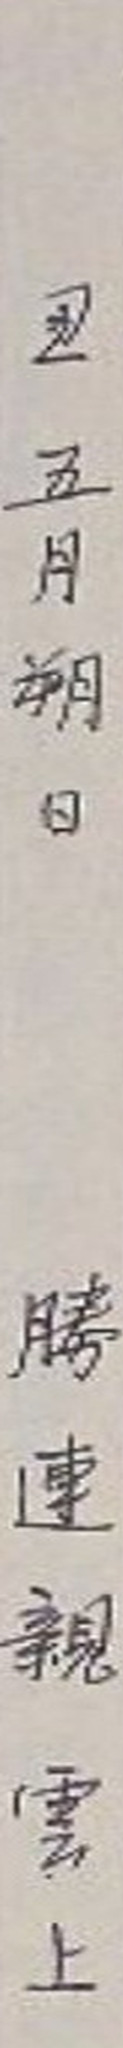丑五月朔日勝連親雲上
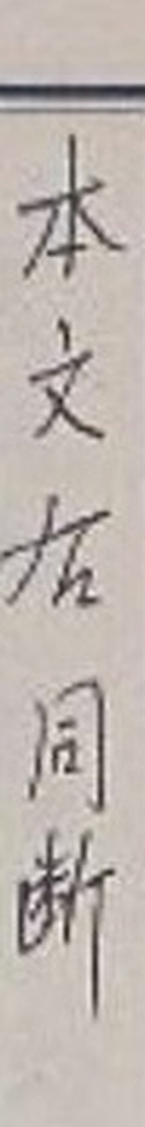本文右同断
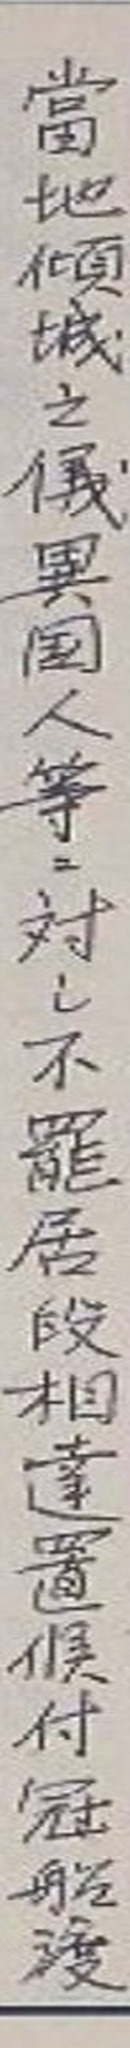当地傾城之儀異国人等に対し不罷居段相達置候付冠船渡
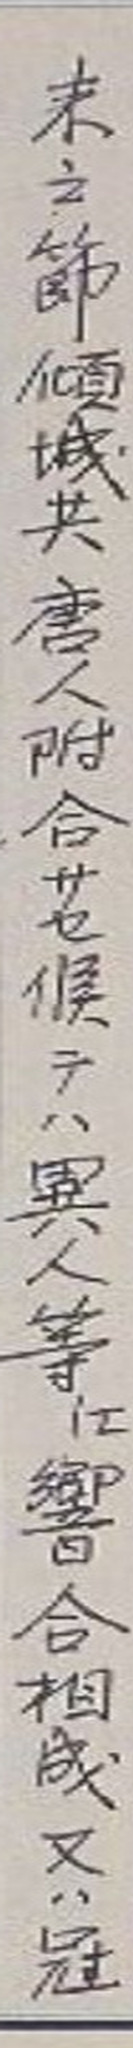来之節傾城共唐人附合させ候ては異人等え響合相成又は冠
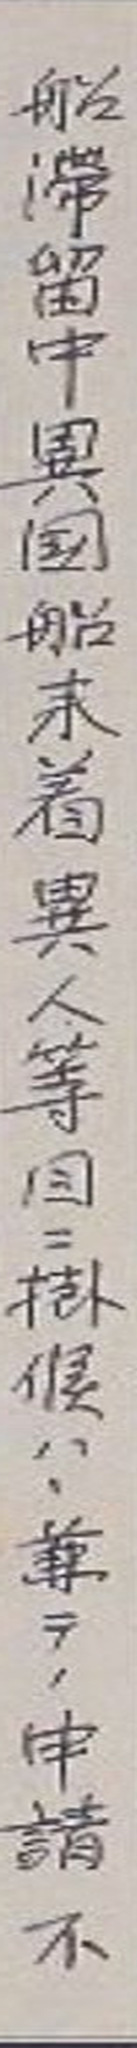船滞留中異国船来着異人等目に掛候はゝ兼ての申請不
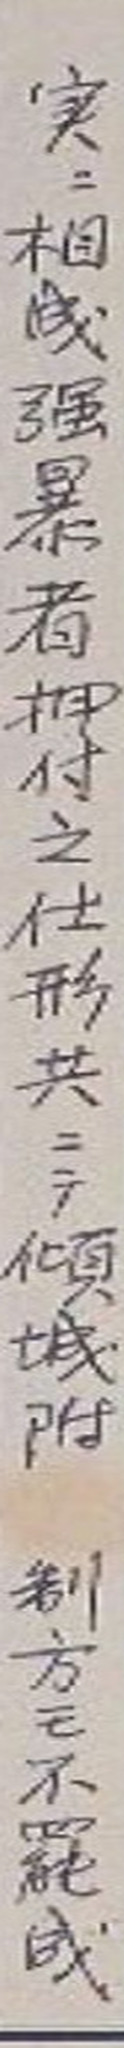実に相成強暴者押付之仕形共にて傾城附制方も不罷成
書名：支那冊封使来琉諸記 下巻
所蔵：University of the Ryukyus Library
